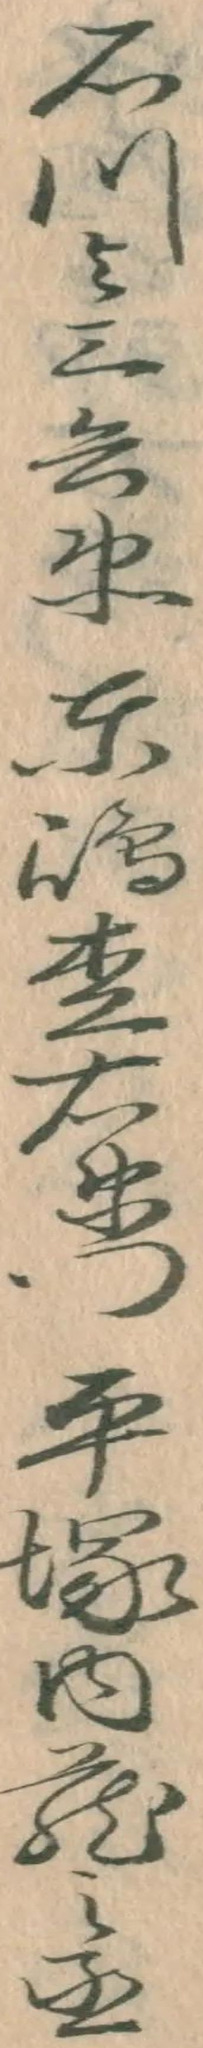石川与三兵衛東島杢右衛門平塚内蔵之丞
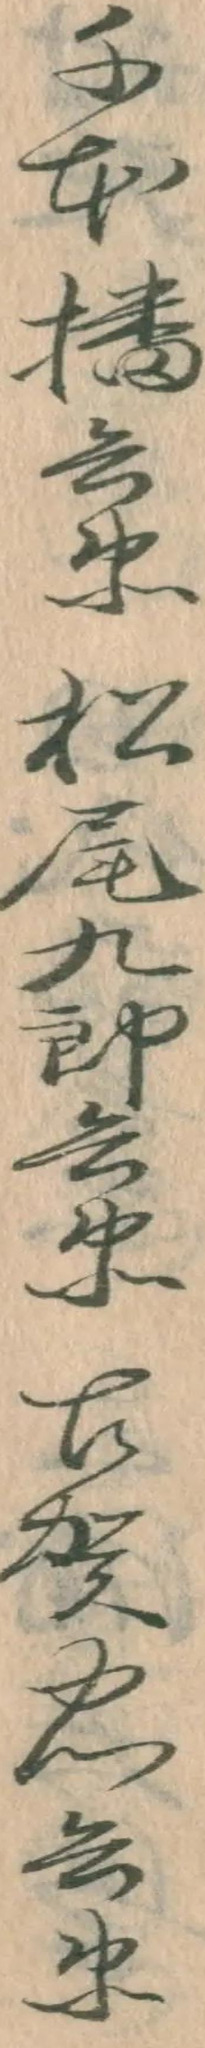千本播兵衛松尾九郎兵衛古賀忠兵衛
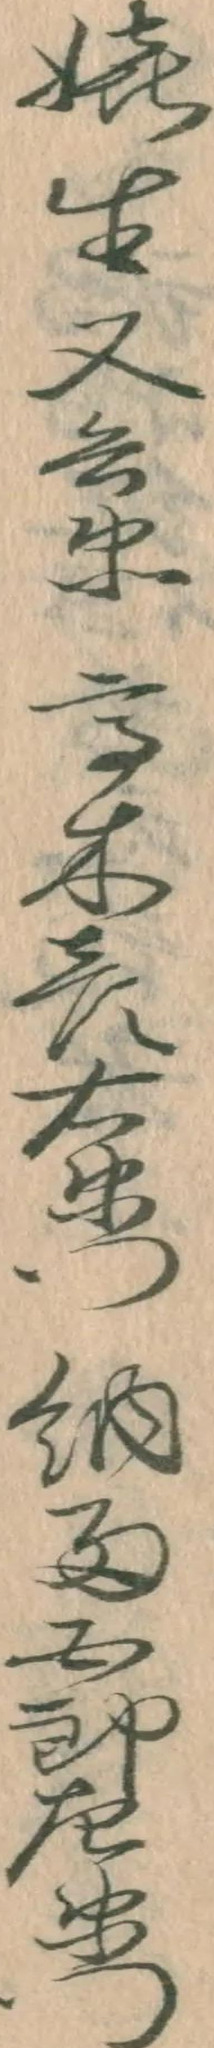嬉生又兵衛高木彦右衛門納酉五郎左衛門
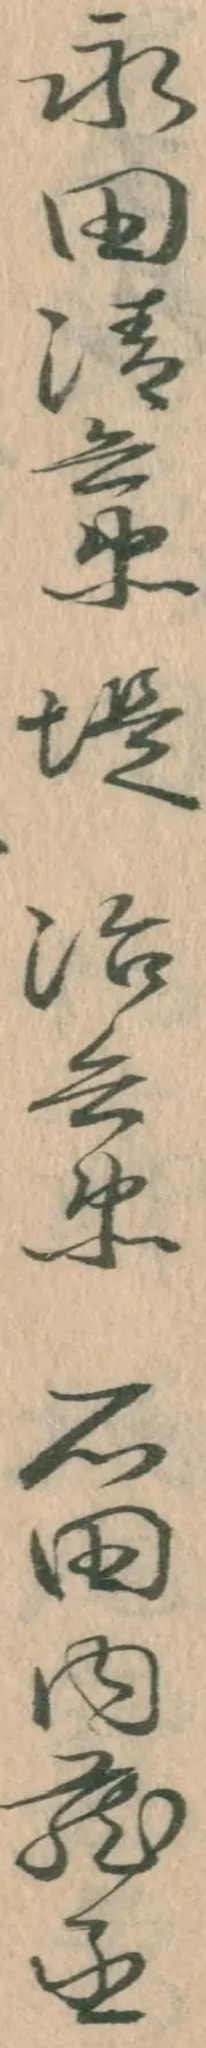永田清兵衛堤治兵衛石田内蔵丞
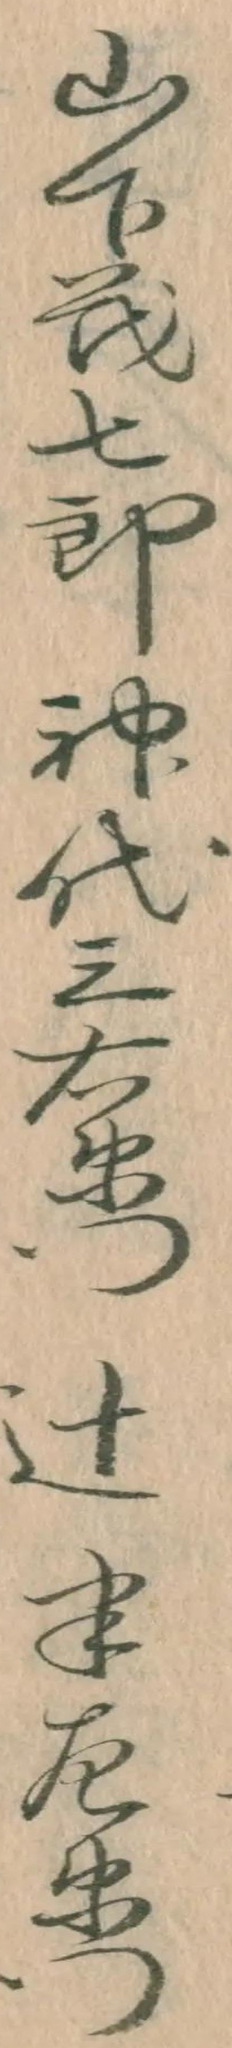山下茂七郎神代三右衛門辻半左衛門
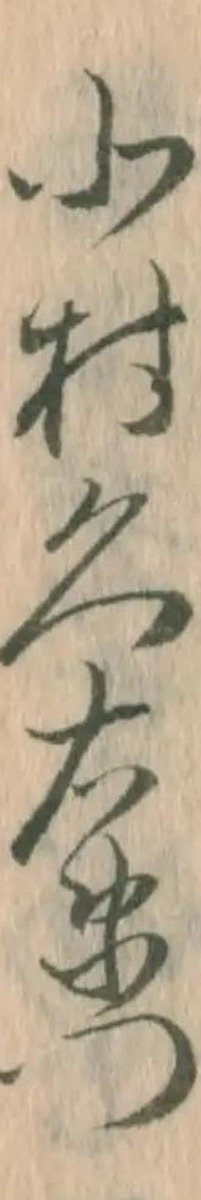北村久右衛門
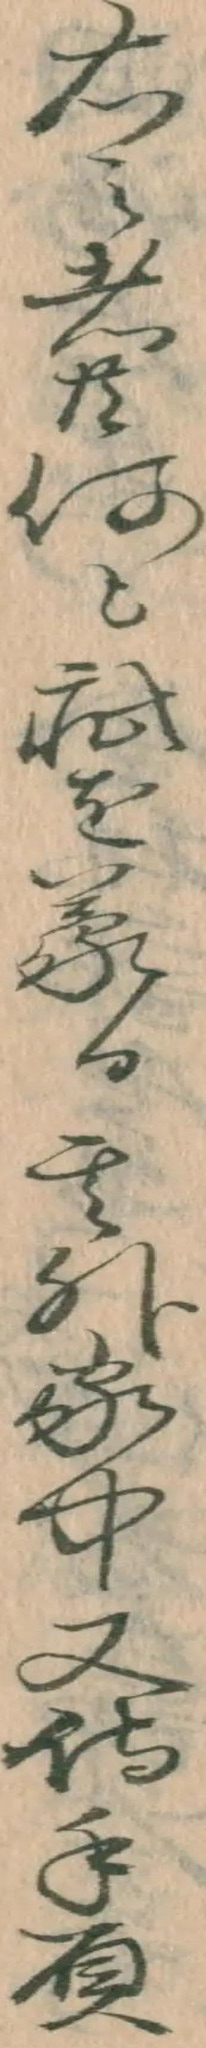右之者共何も疵を承る其外家中又侍手負
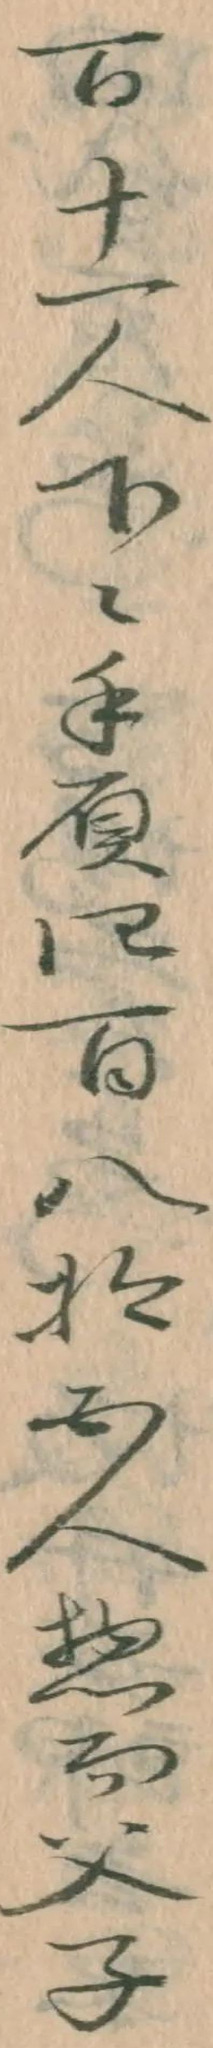百十一人下々手負四百八拾五人惣而父子
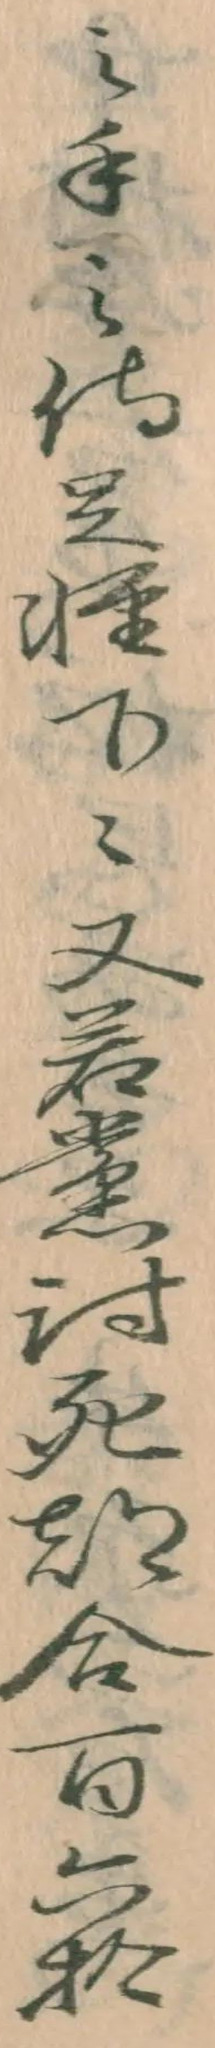之手之侍足軽下々又若党討死都合百六拾
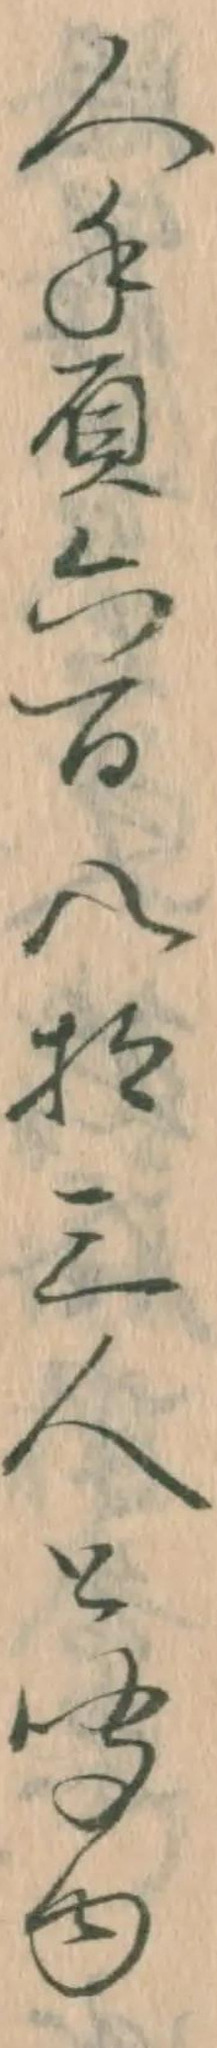人手負六百八拾三人と聞内
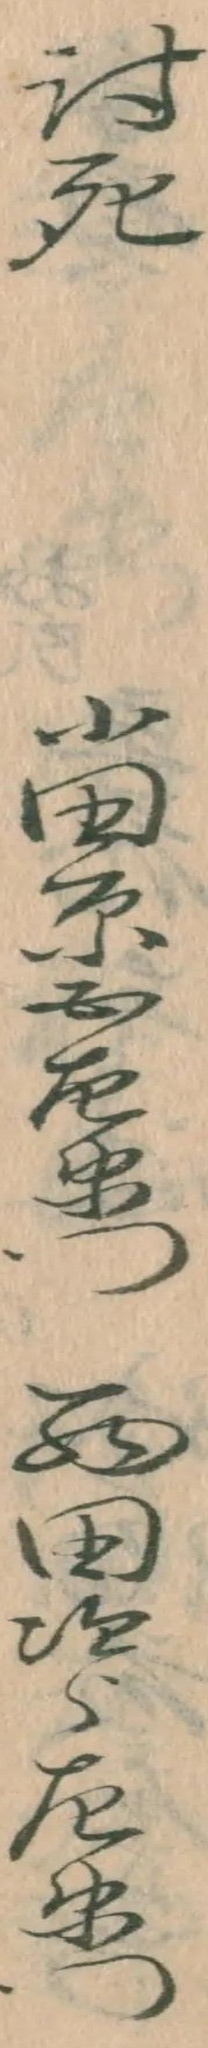討死小田原五左衛門西田次郎左衛門
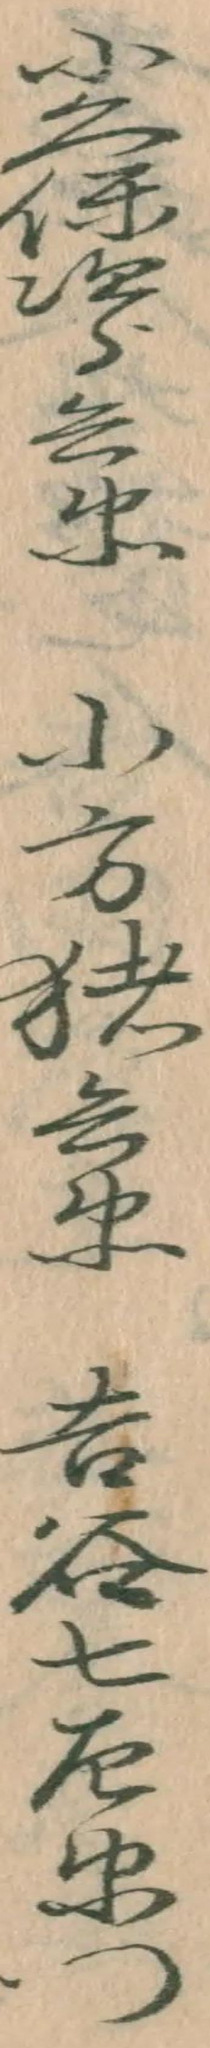小久保次郎兵衛緒方猪兵衛吉谷七左衛門
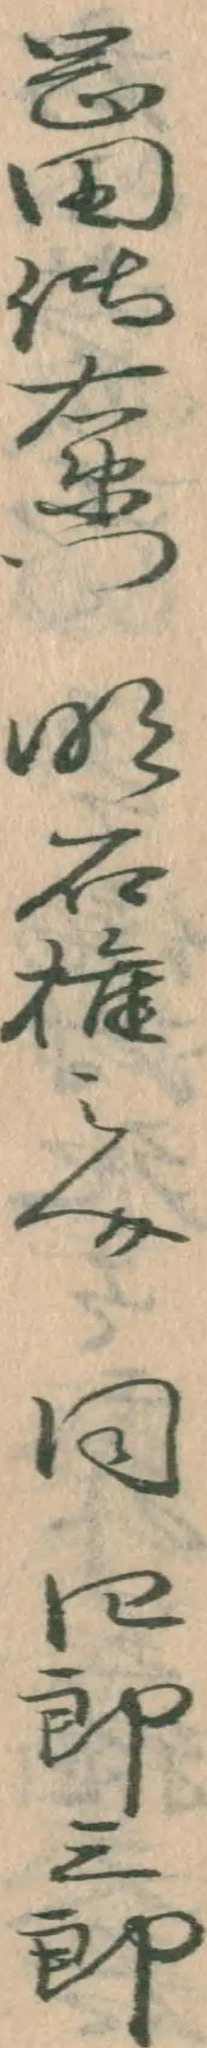岡田伝右衛門明石権之介同四郎三郎
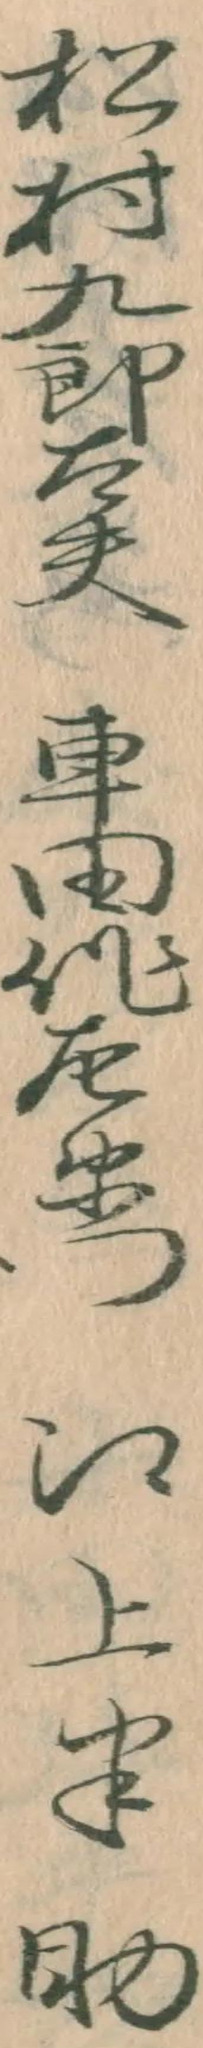松村九郎太夫車田作左衛門江上半助
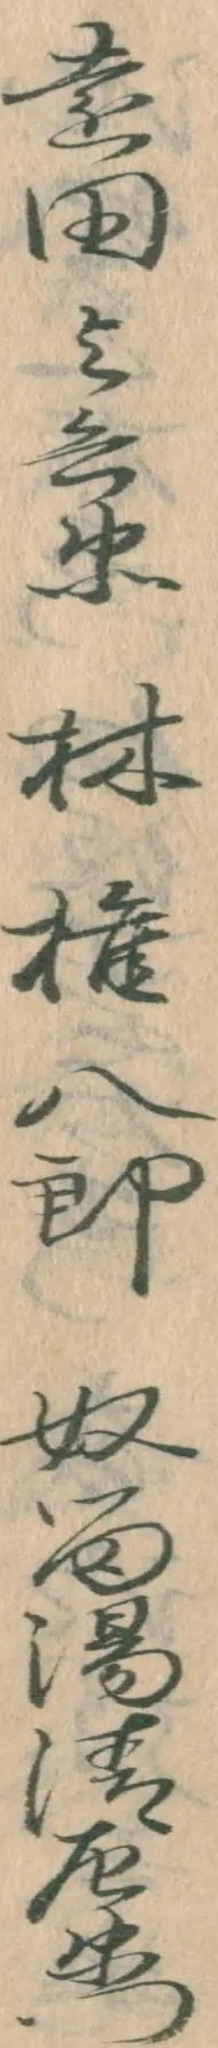遠田与兵衛林権八郎奴留湯清左衛門
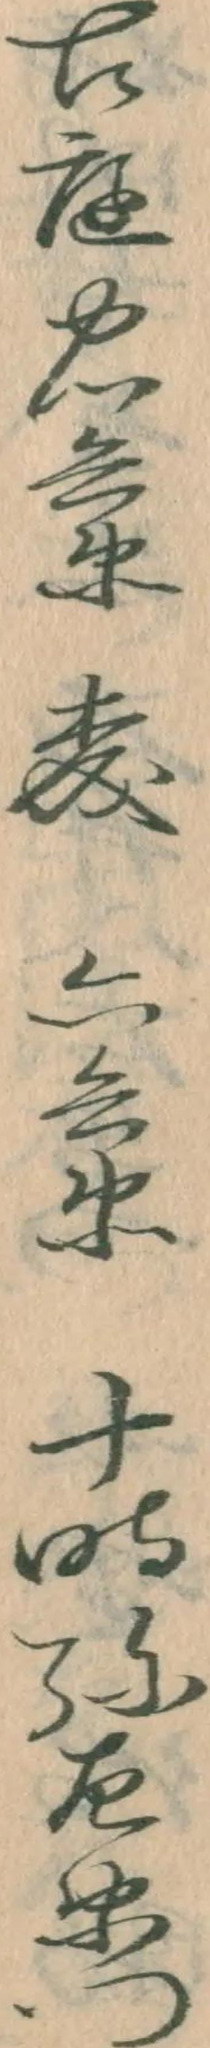古庭忠兵衛森六兵衛十時弥左衛門
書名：切支丹御退治記 49巻. [9]
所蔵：国立国会図書館 National Diet Library, JAPAN
